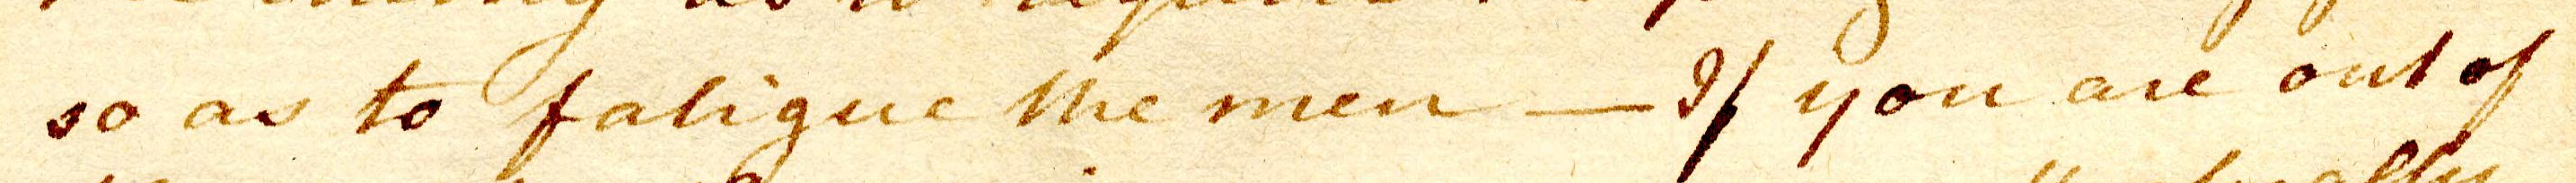so as to fatigue the men- If you are out of
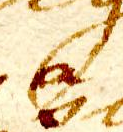a
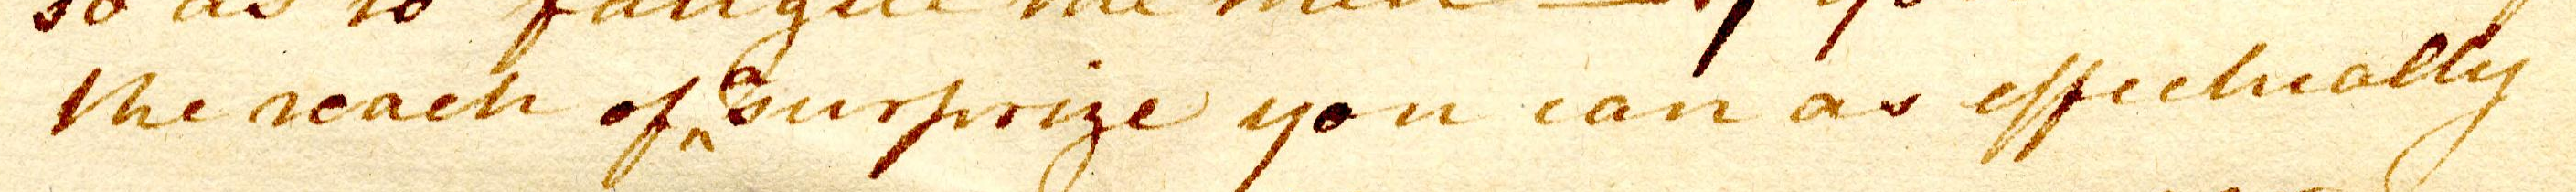the reach of ^ surprize you can as effectually
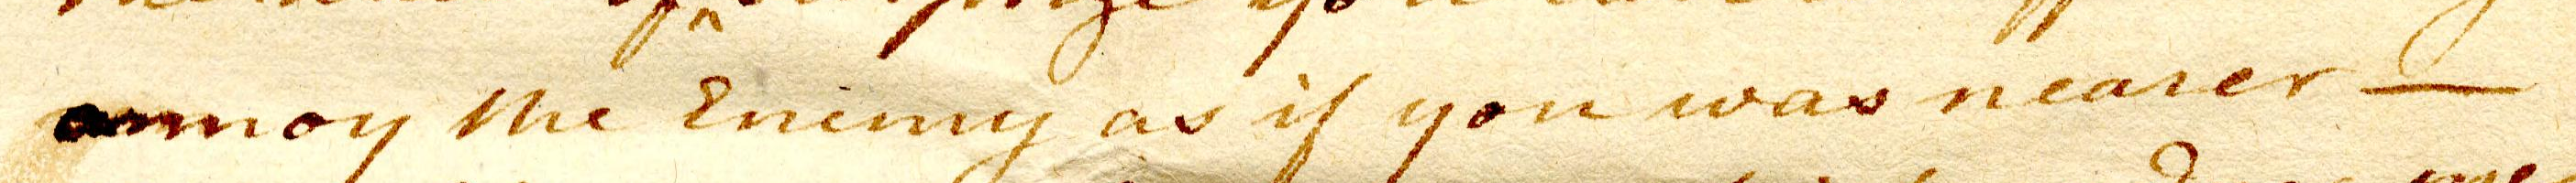annoy the Enemy as if you was nearer-
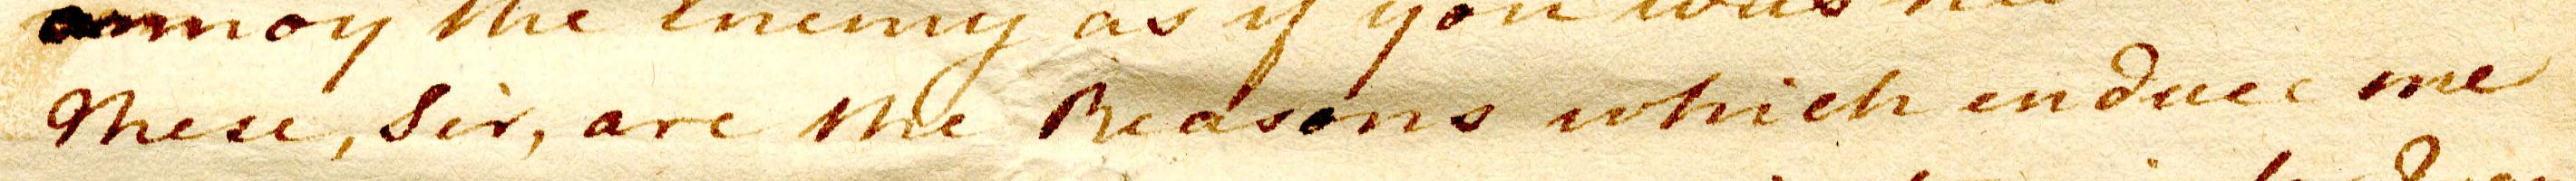these, Sir, are the Reasons which enduce me
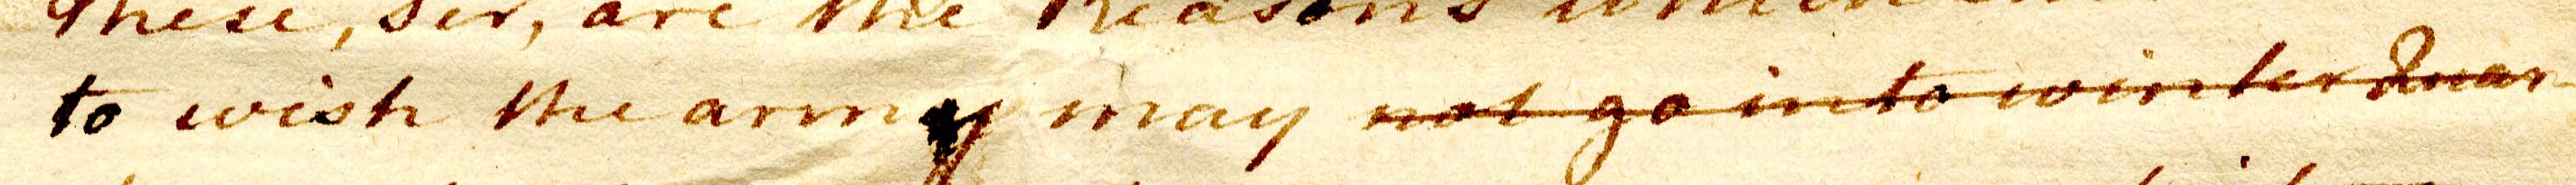to wish the army may [not go into winter Quar-]
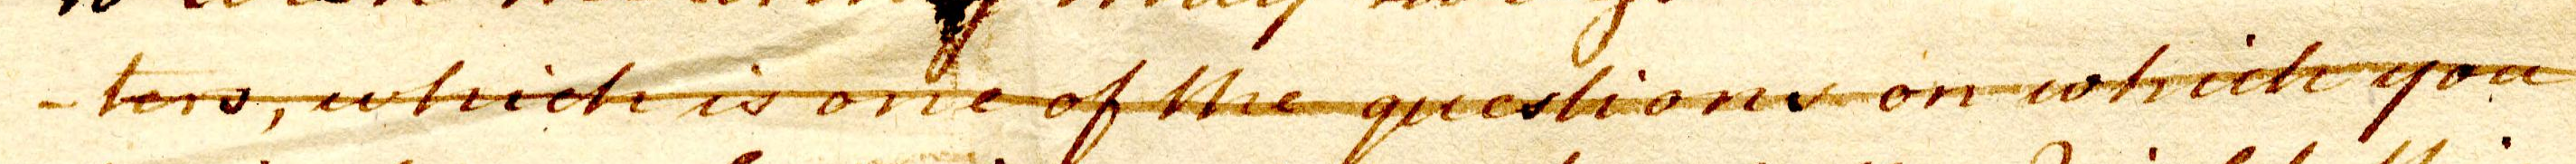-[ters, which is one of the questions on which you]
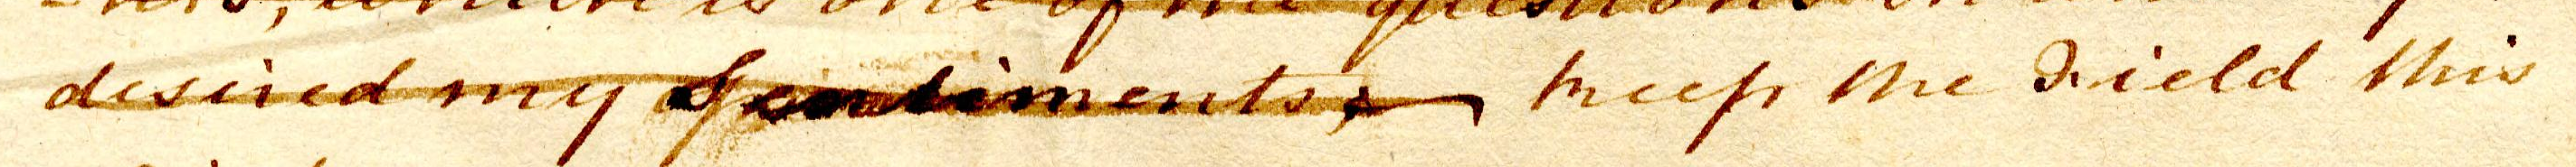[desired my sentiments-] keep me Field this
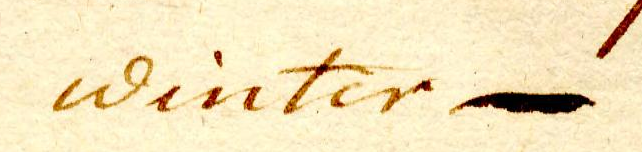Winter-
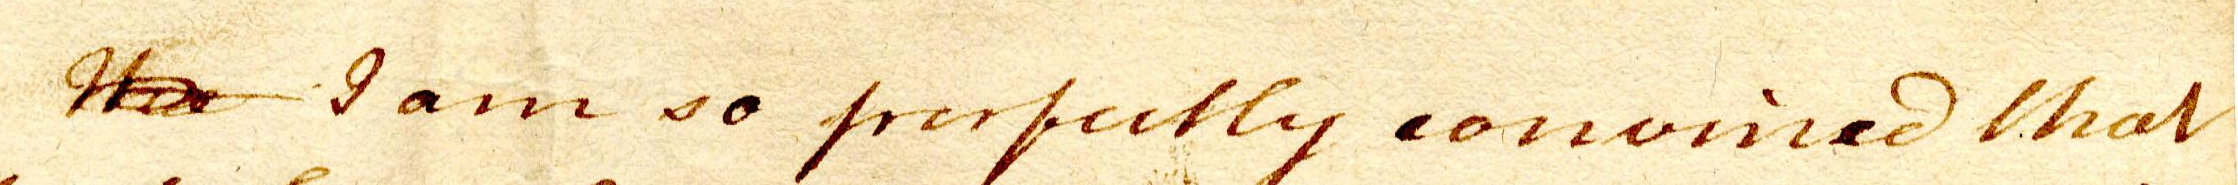[___] I am so perfectly convined that
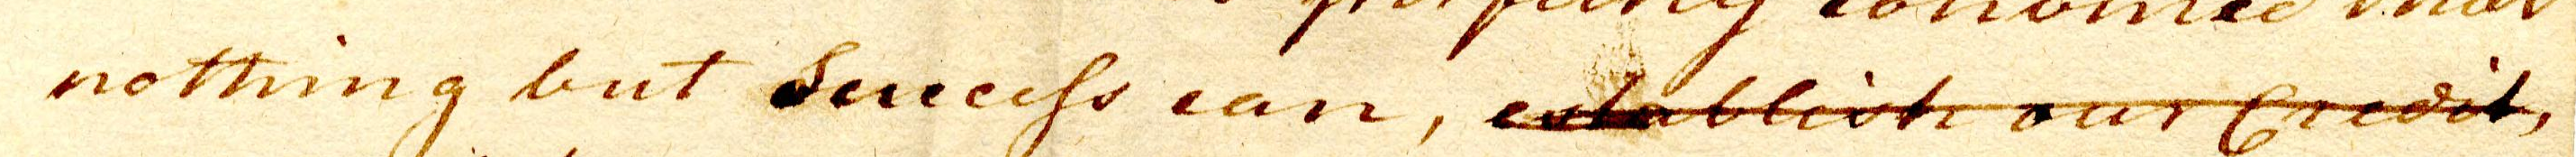nothing but Success can, [establish our Credit]
